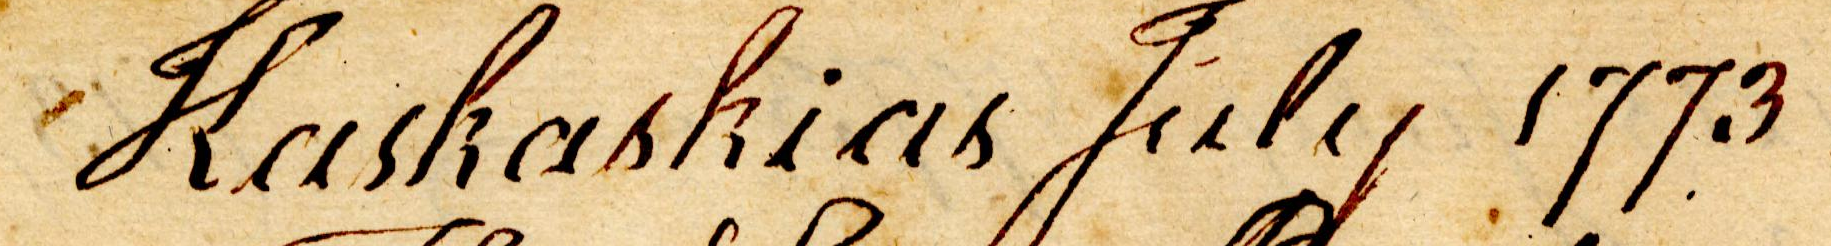Kaskaskias July 1773
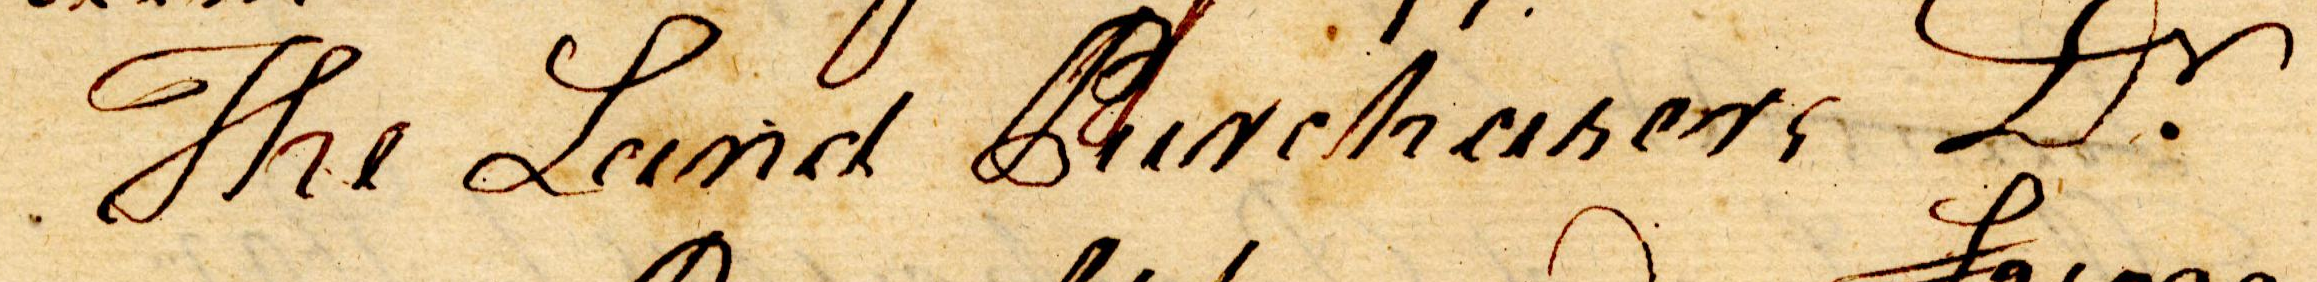The Land Purchasers D^r.
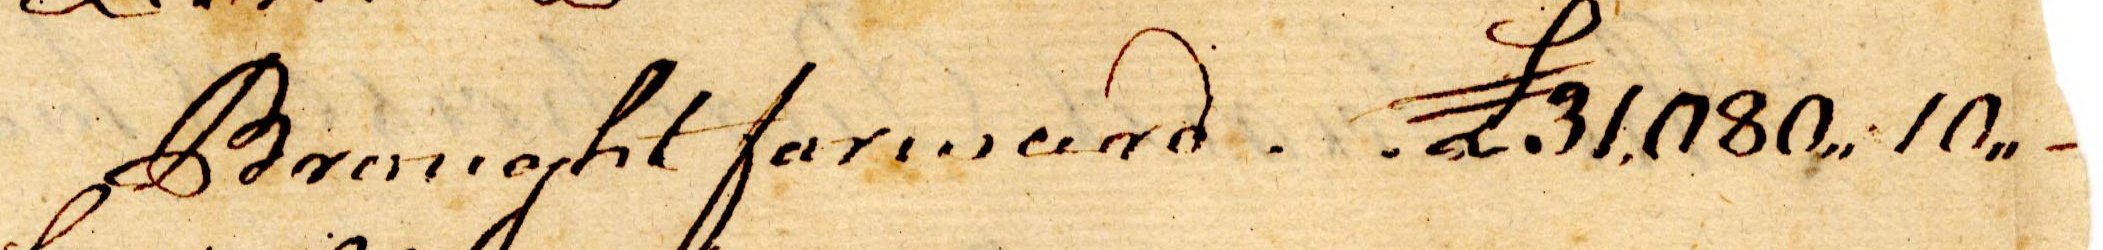Brought forward.. £31,080.10.
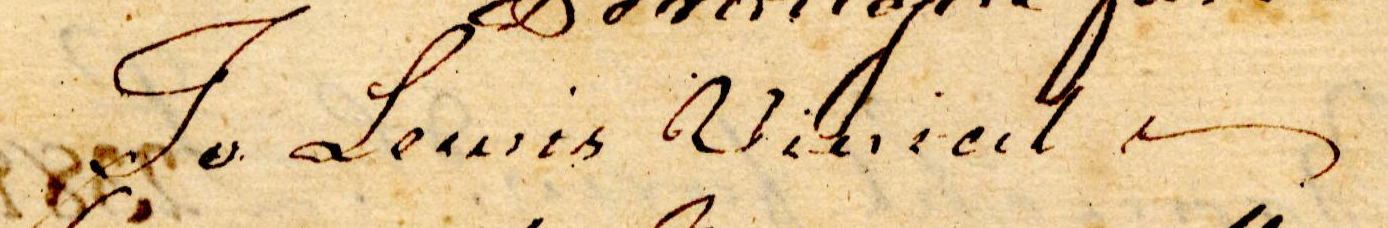To Lewis Vinicel-
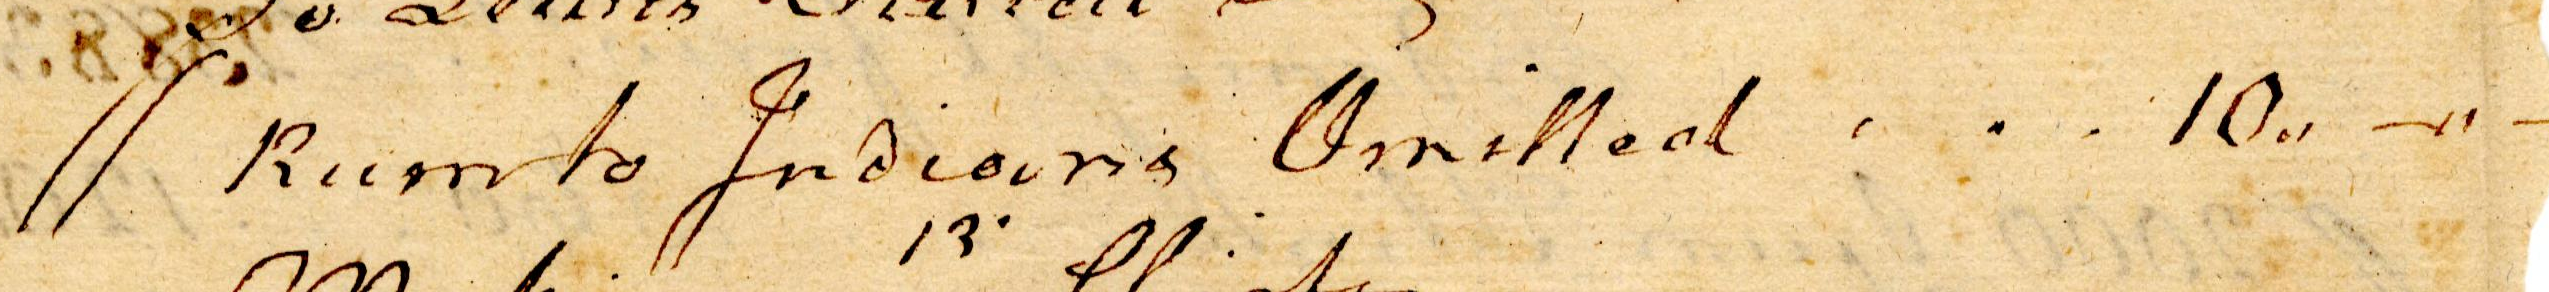Rum to Indians Omitted ...10.-
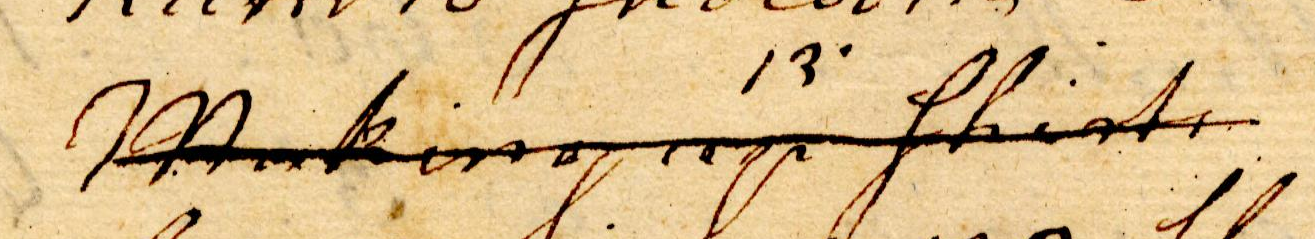[making up shirts]
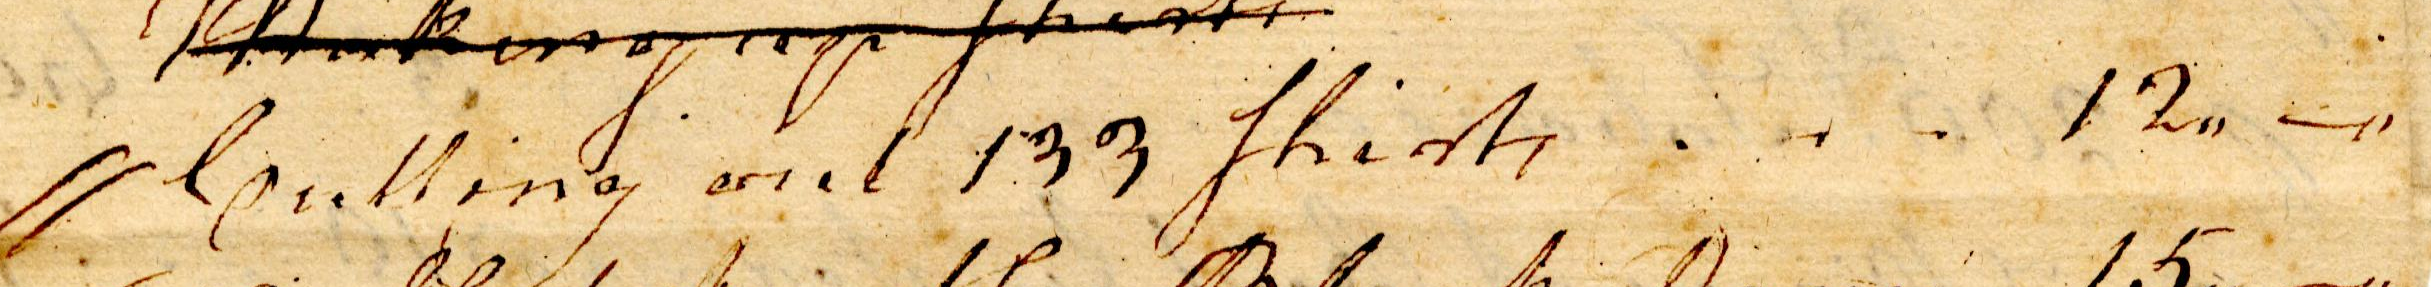Calling out 133 Shirts... 12.-
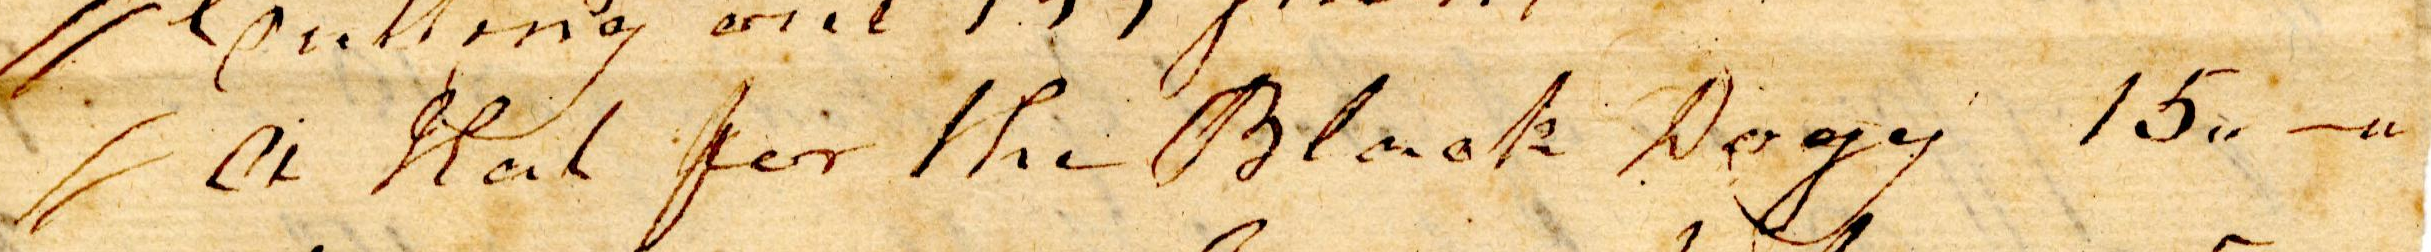A Hat for the Black Dogy 15.-
